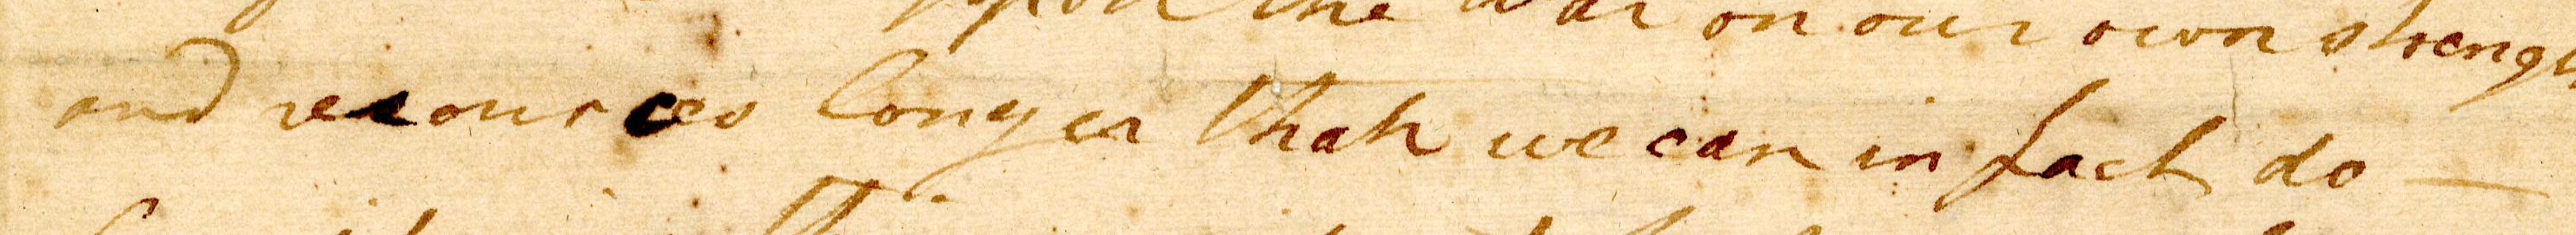and resources Convey that we can in fact do.-
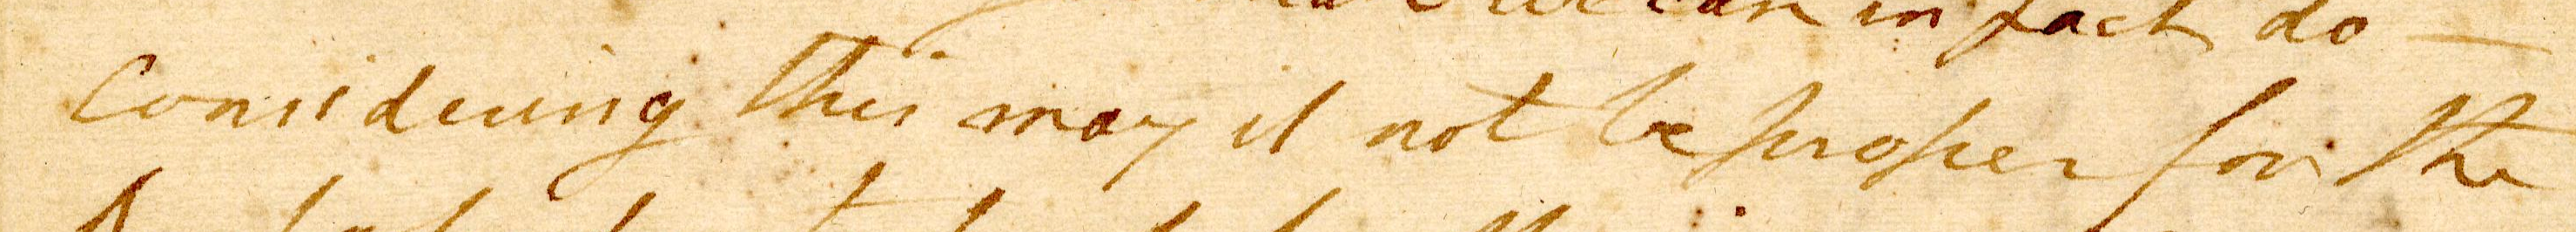Considering this may it not be proper for the
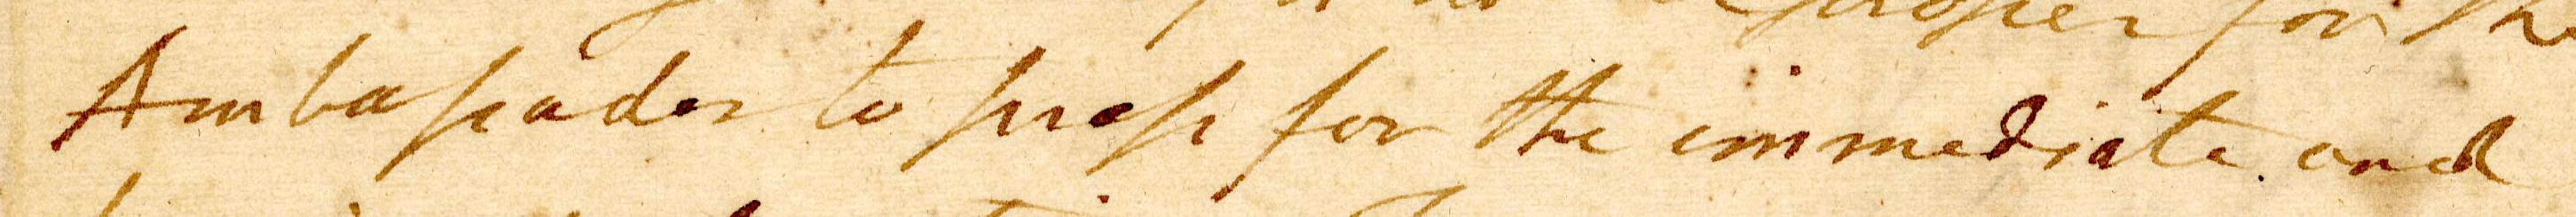Ambassador to press for the immediate and
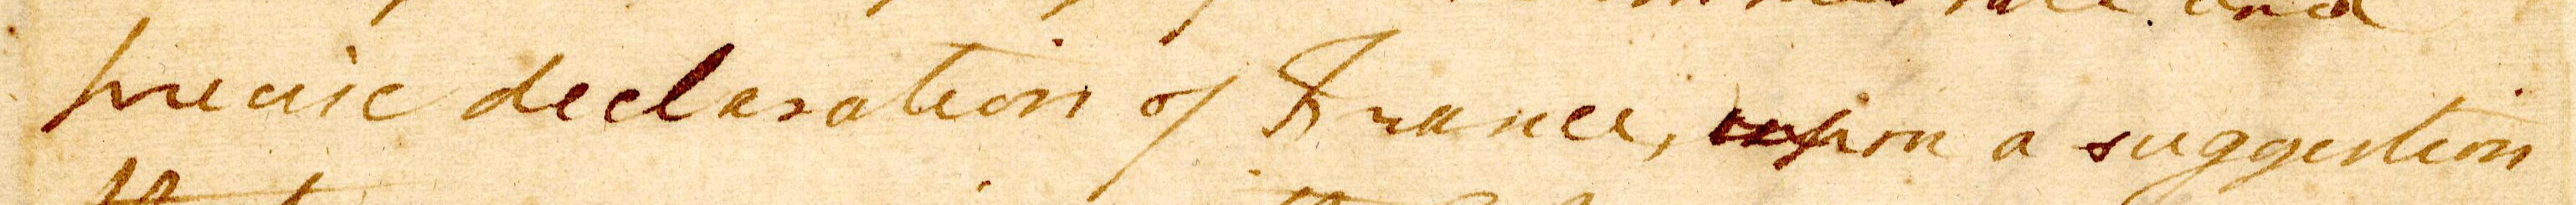precise declaration of France, [up] in a suggestion
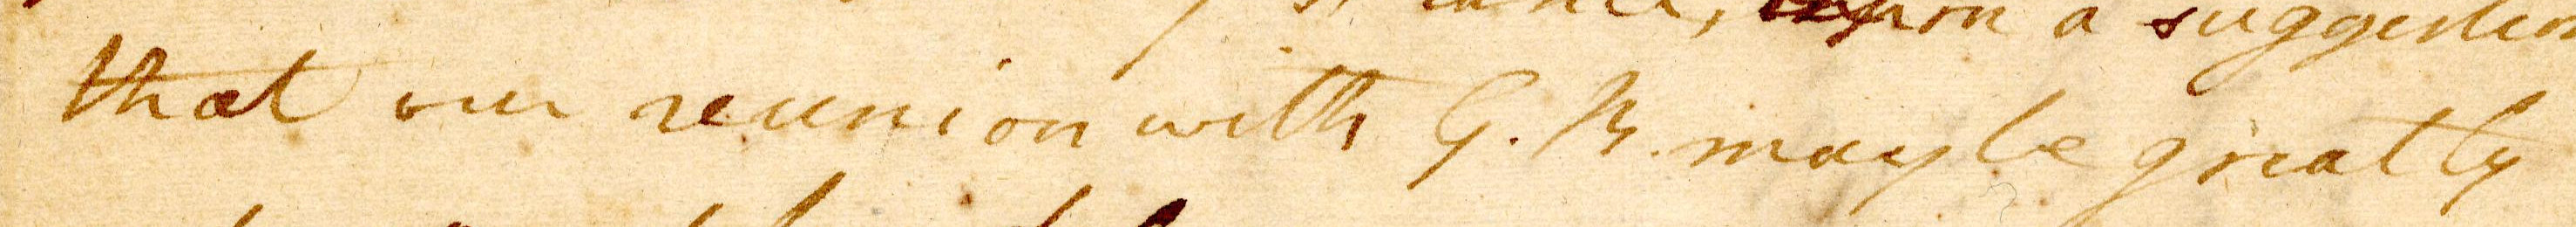that our reunion with G. B. may be greatly
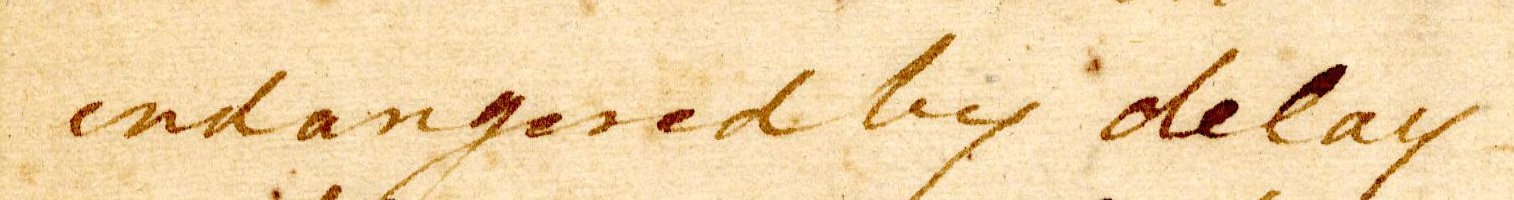endangered by delay
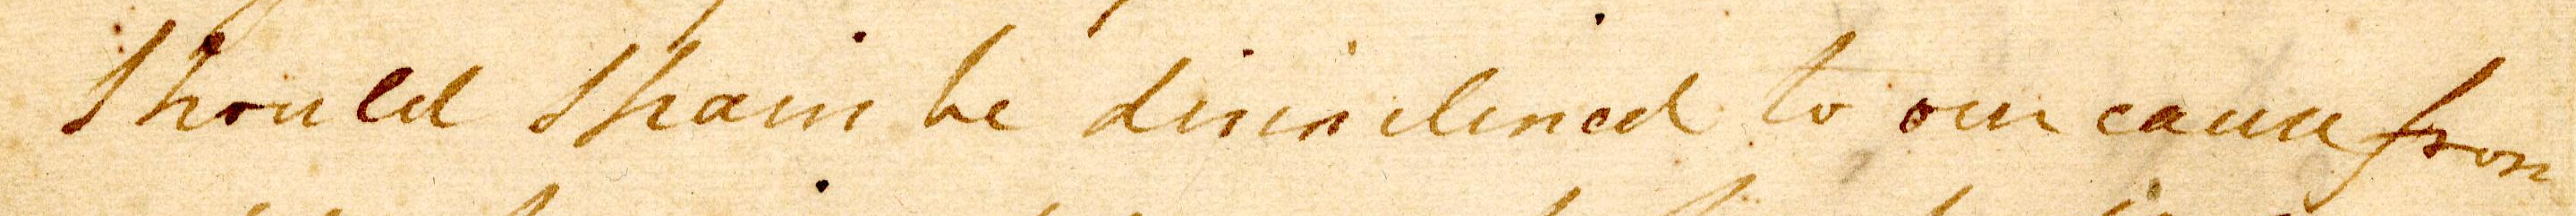Should Spain be disinclined to our cause from
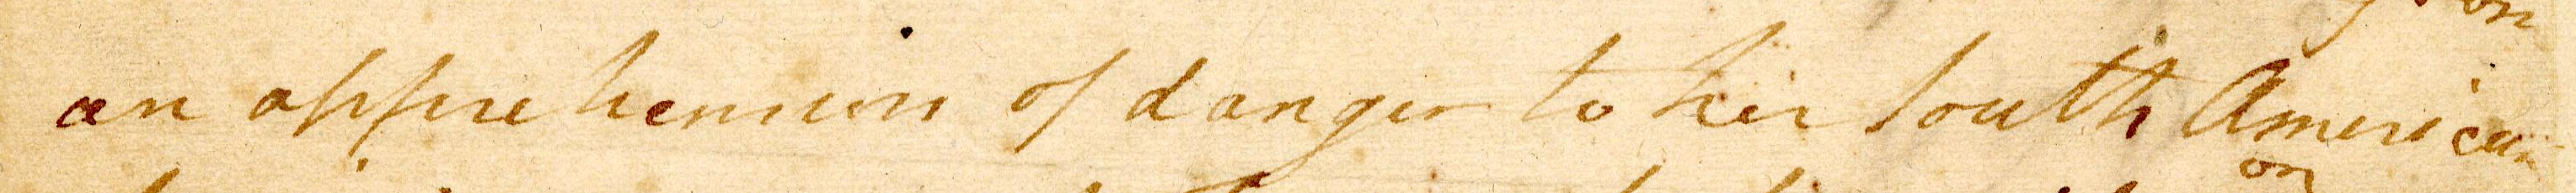an apprehensions of danger to her South America
